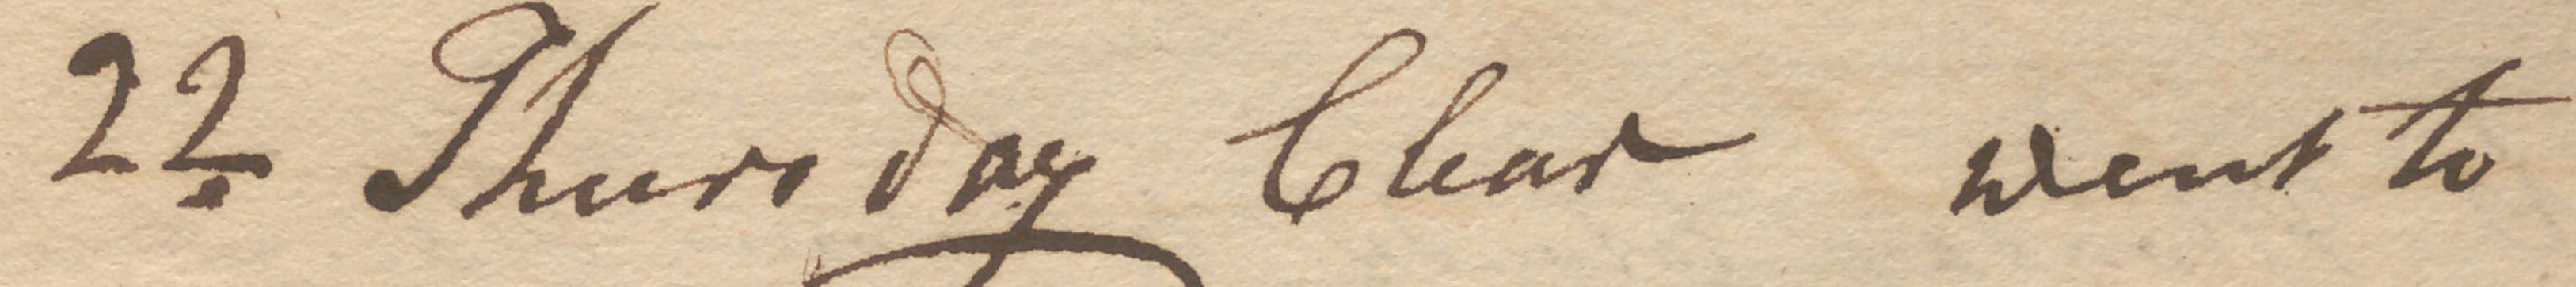[_t_] Thuirsday Clear went to
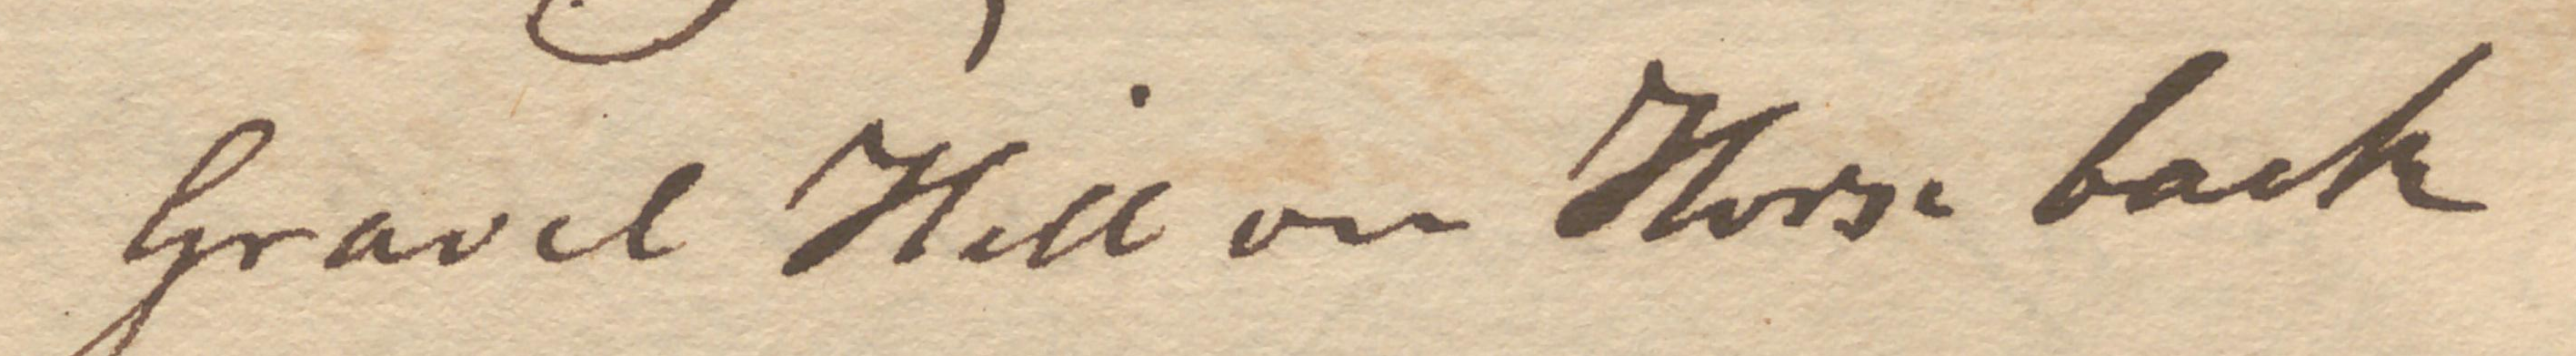Gravel Hill on Horse back
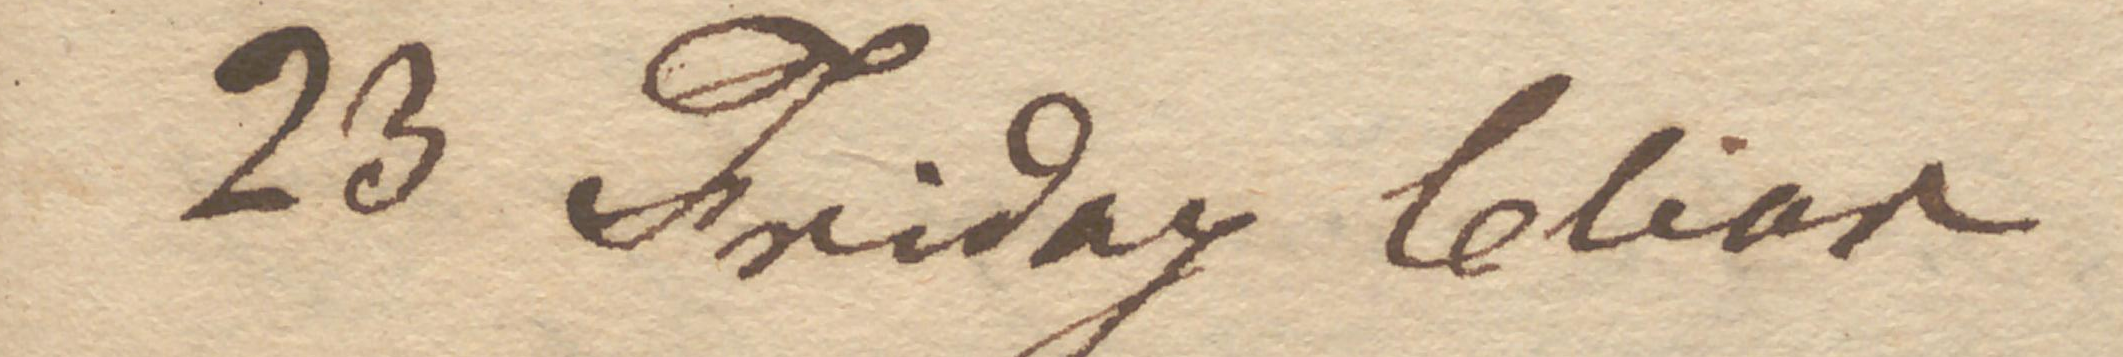23 Friday Clear
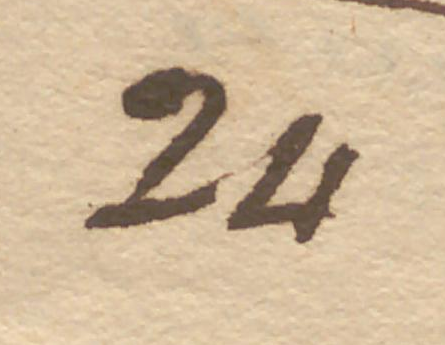24
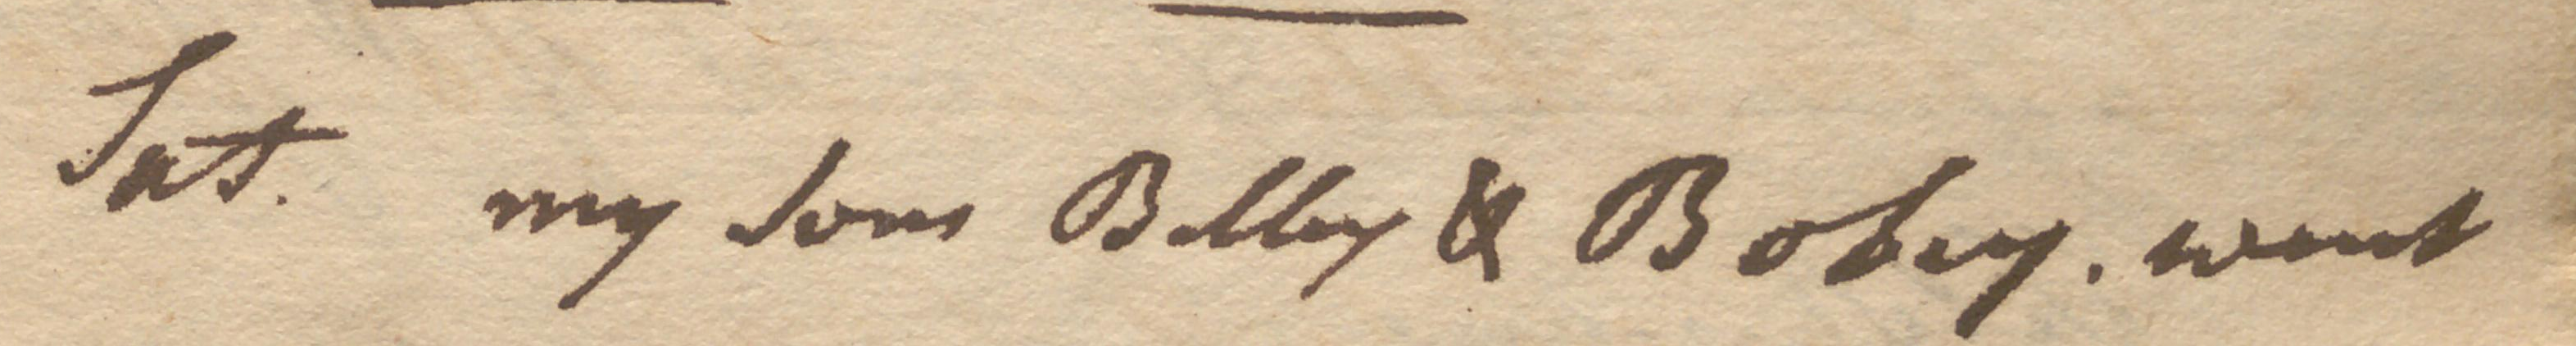Sat. my sons Belley & Bobey, went
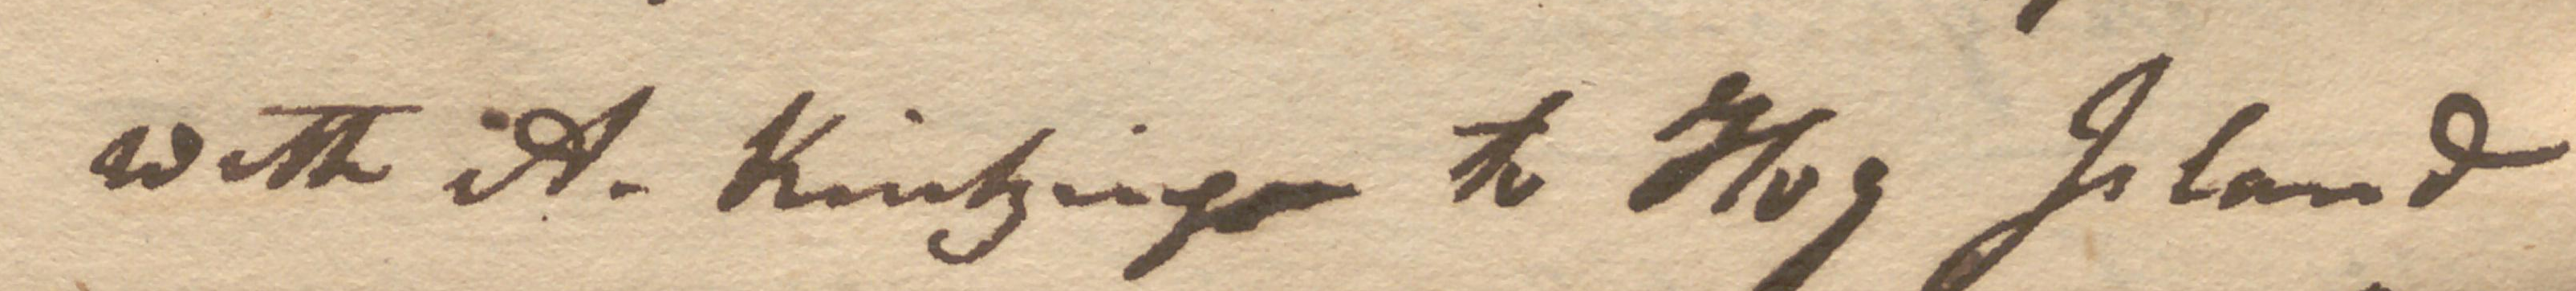with A. Kintinge to Hog Island
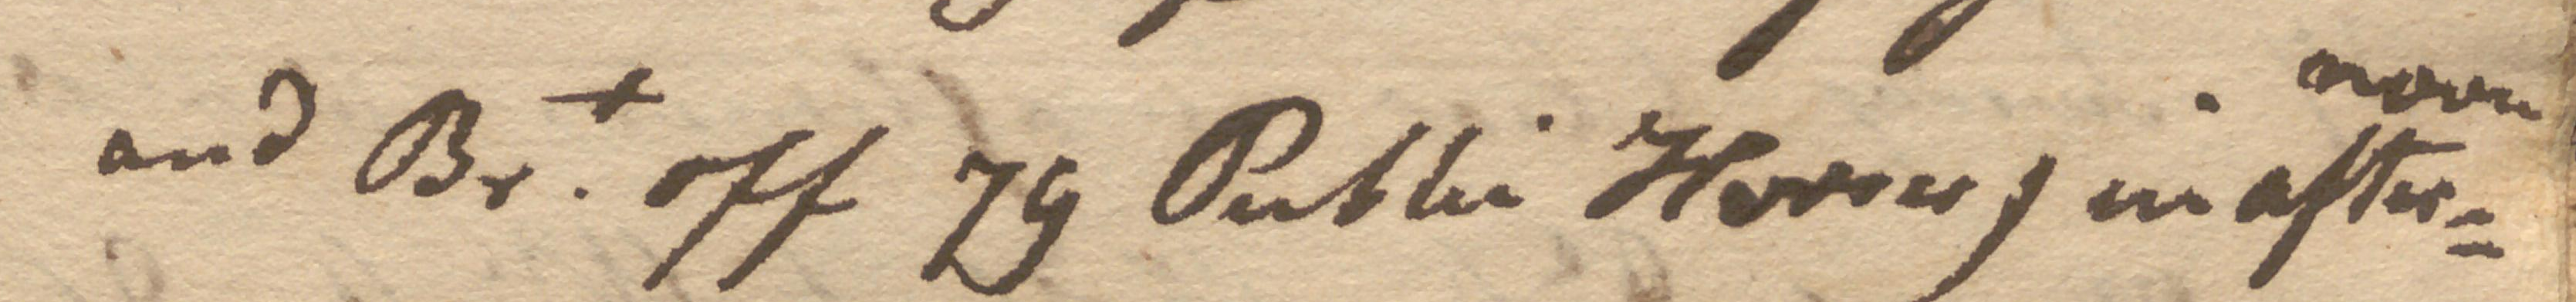and Br^t. off 79 Public Horser I in after-
